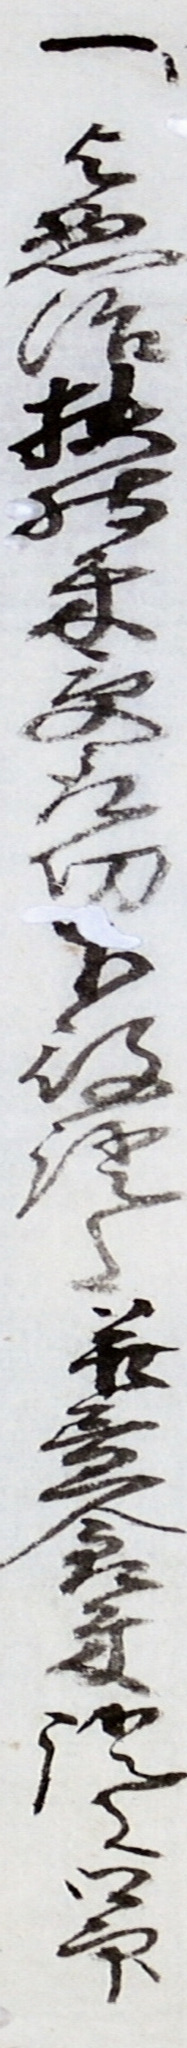一与惣治扶持米受取切下役証文并昼食米証文御印
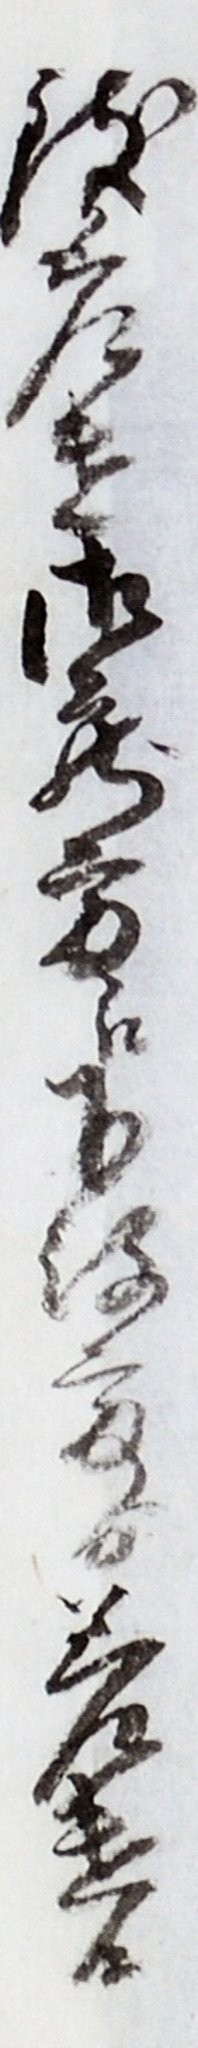致差遣御蔵方江下役方より差遣候
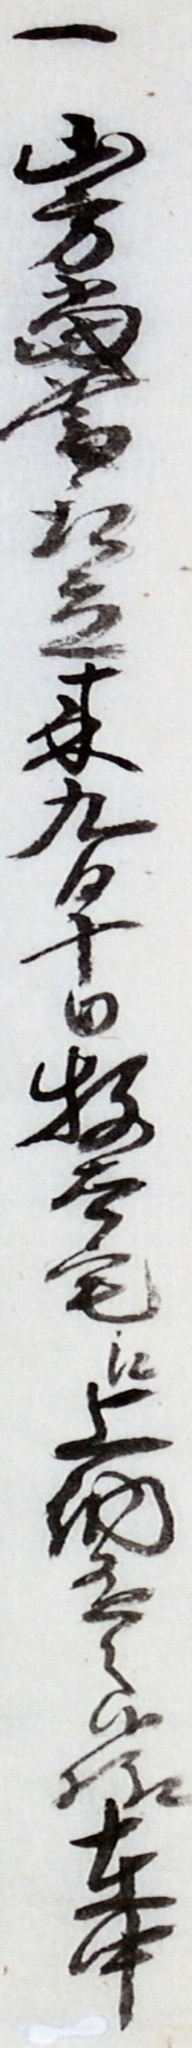一山方当番取立来九日十日牧太宅江上納有之候様在中
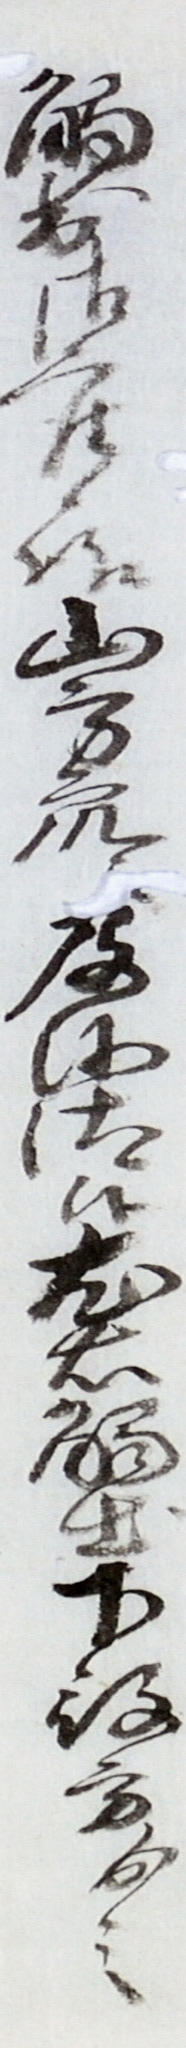触出御座候様山方衆江及沙汰候尤右触書下役方より之
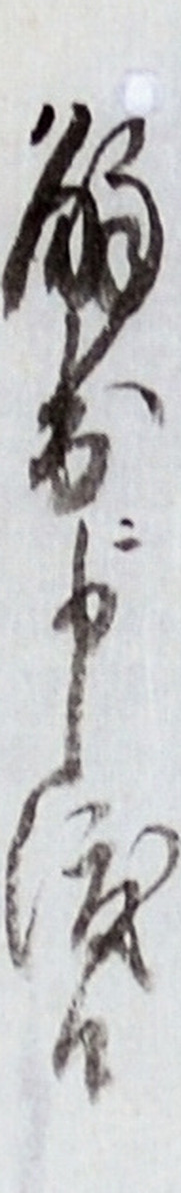触出ニ申渡候
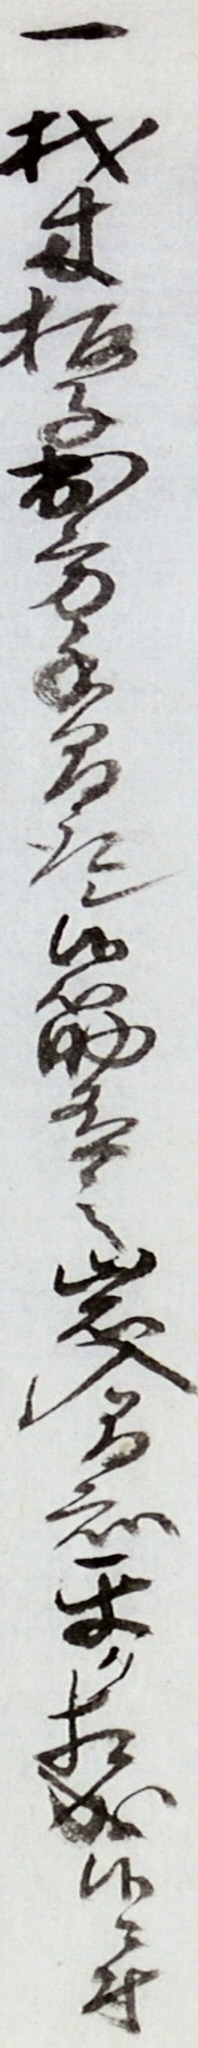一材木板子出方手間取れ候筋有之岩入間知早く相成候ニ付
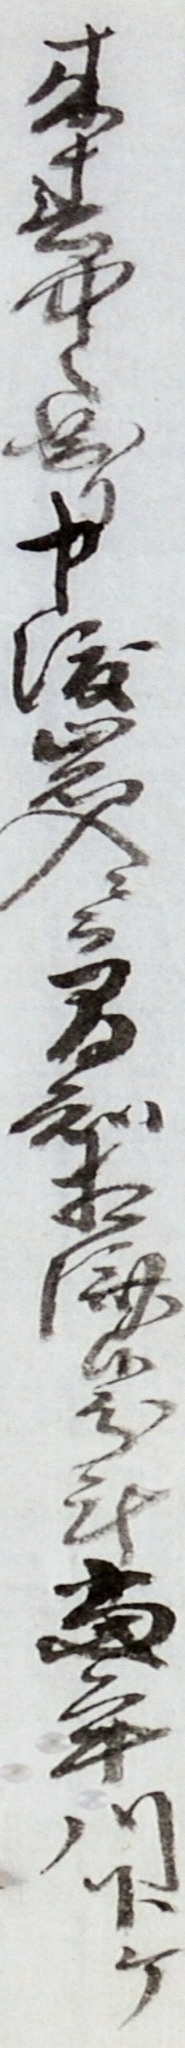来春中々図り申渡岩入ニ而間知相済候分斗当年川下ケ
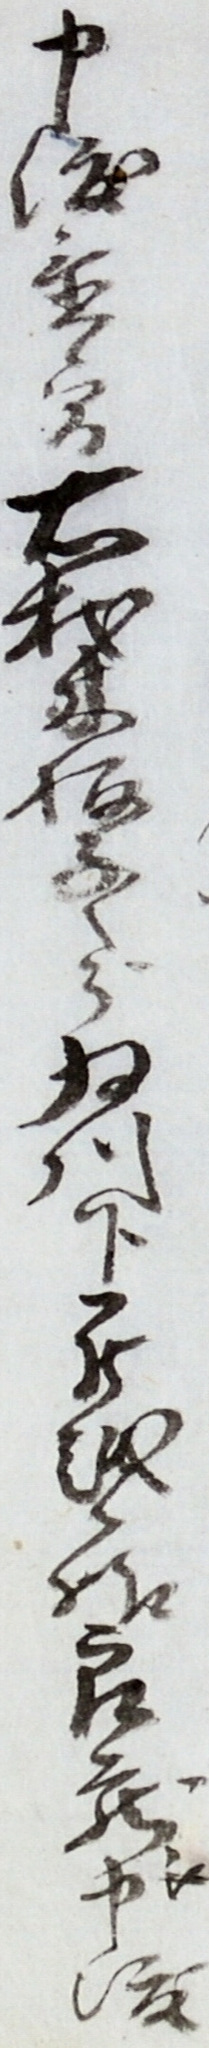申渡置候間右材木板等之分為川下罷越候様良蔵江申渡
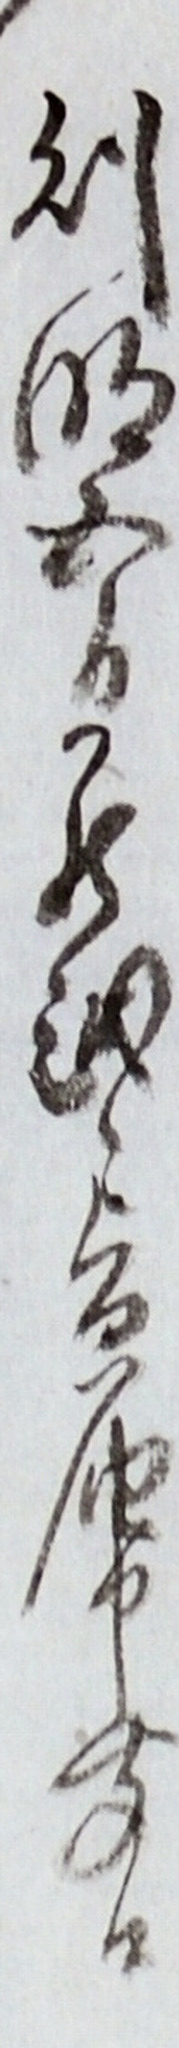則明五日罷越候旨届申聞候
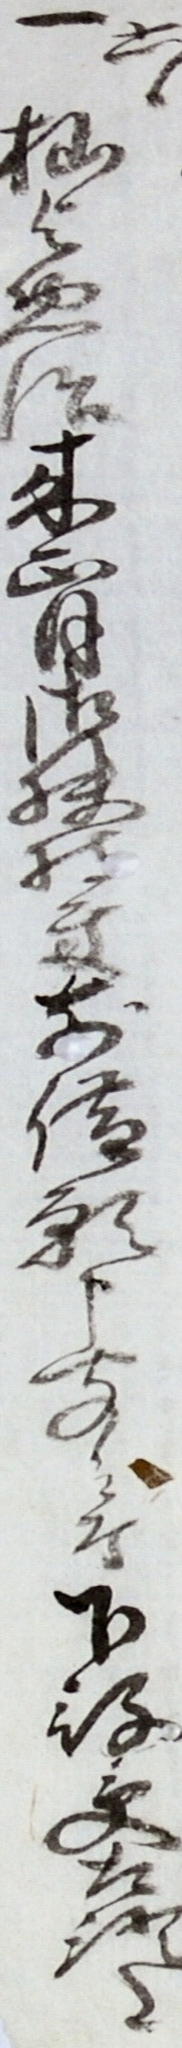一杣与惣治来正月御扶持米前借願申聞候ニ付下役受取證之
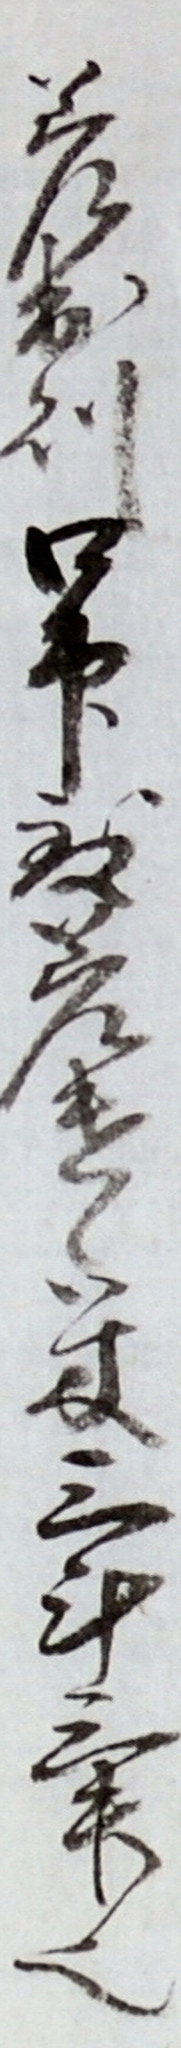差出則口印致差遣候御米三斗三升也
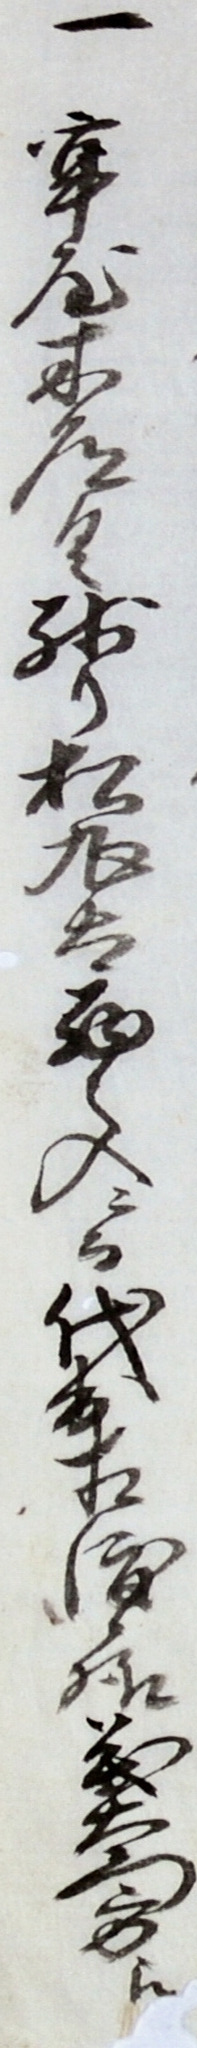一牢屋木道具残り松丸太西之入ニ而代書相渡候様義右衛門方江

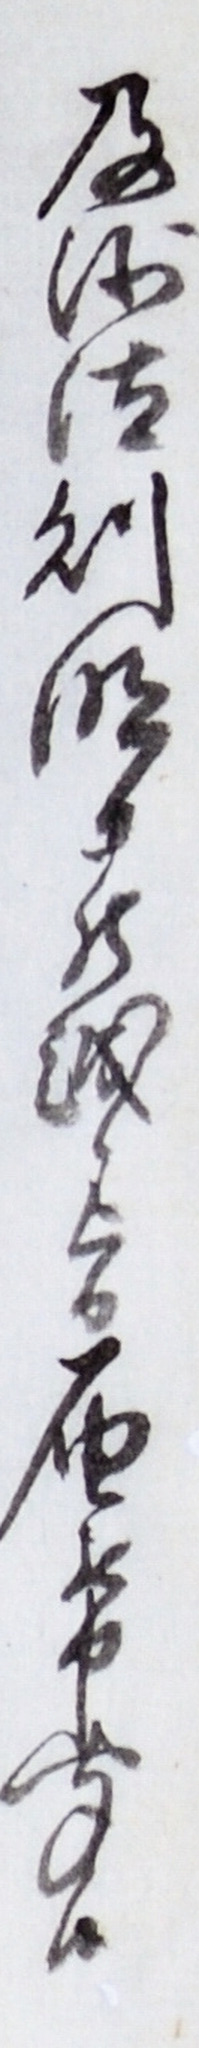及沙汰則明日罷越候間届被申聞候
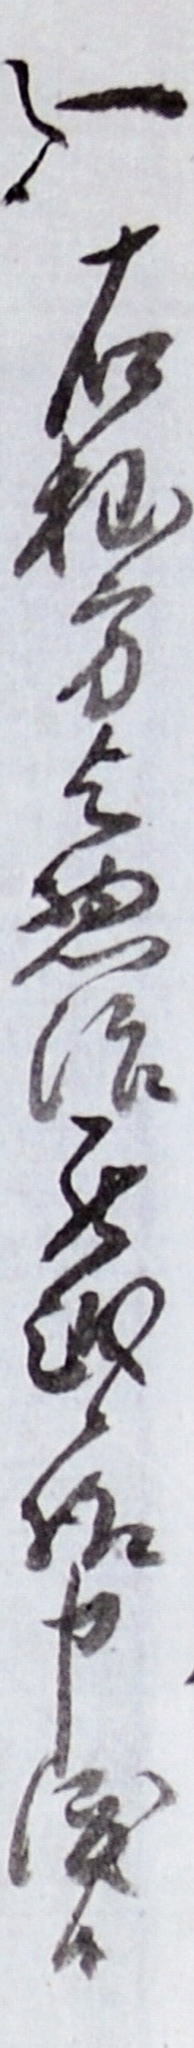一右杣方与惣治罷越候様申渡候
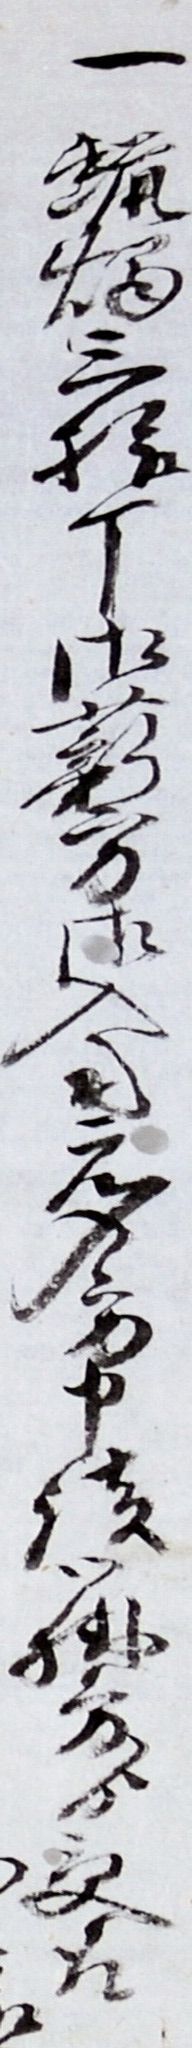一蝋燭三拾丁御藪方御入用元〆方申談御払方より受取
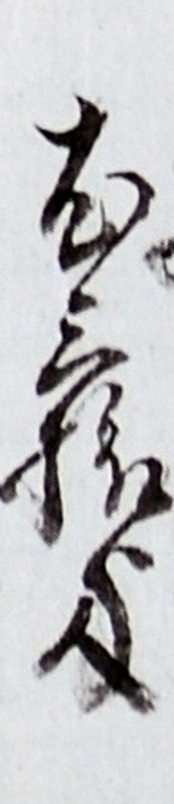尤三拾匁
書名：御山奉行御用控
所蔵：伊那市立高遠町図書館・合同会社AMANE
